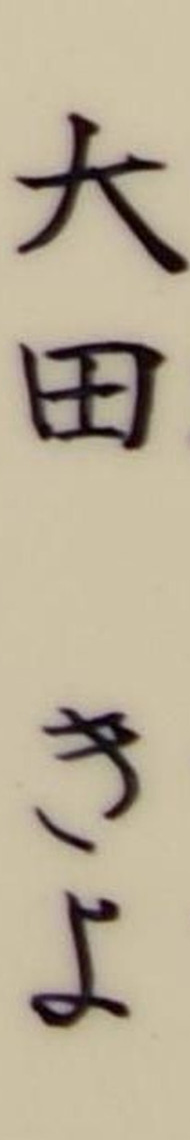大田きよ
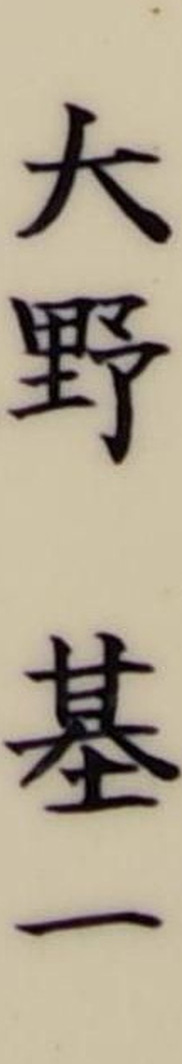大野基一
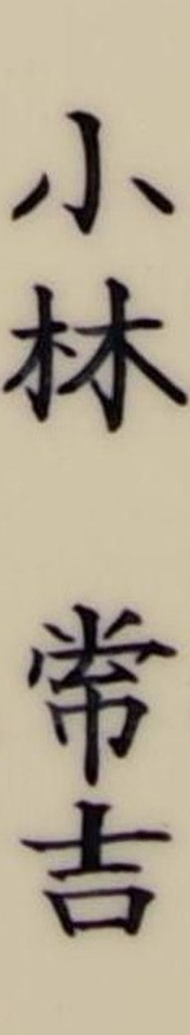小林常吉
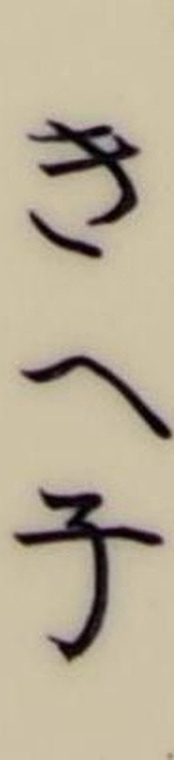きへ子
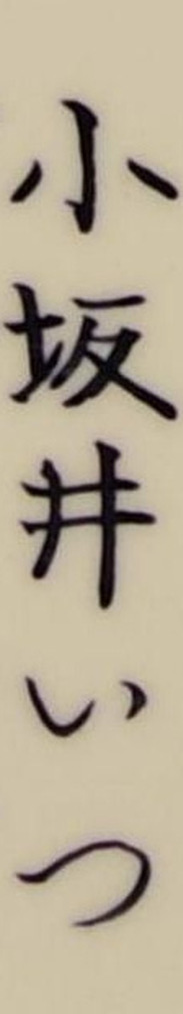小坂井いつ
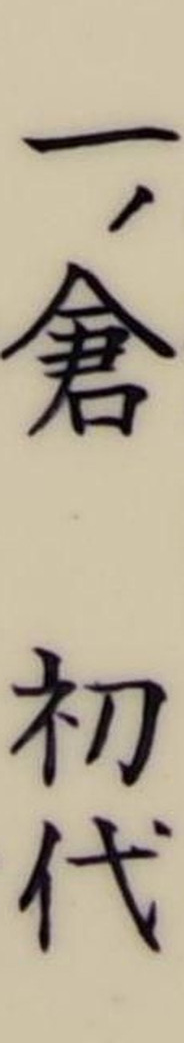一ノ倉初代
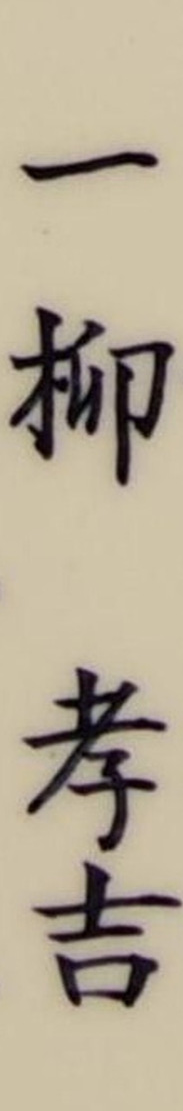一柳孝吉
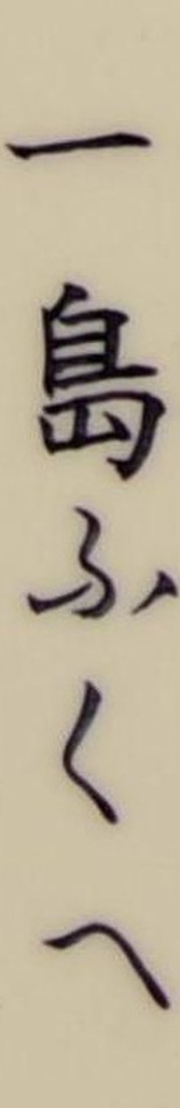一島ふくへ
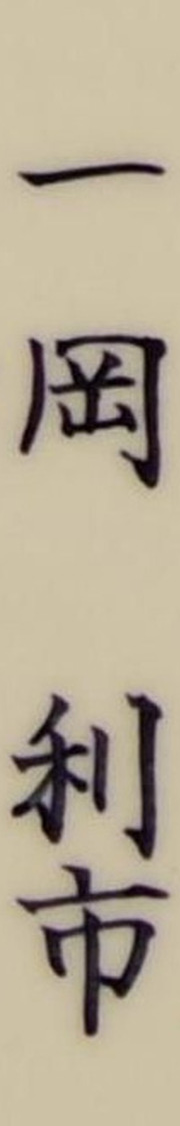一岡利市
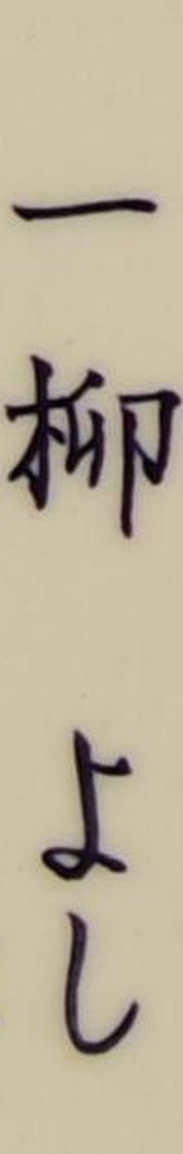一柳よし
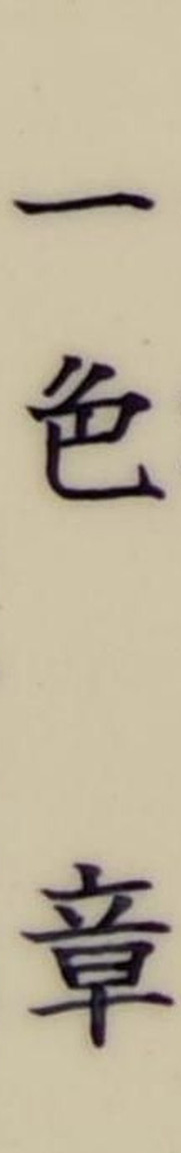一色章
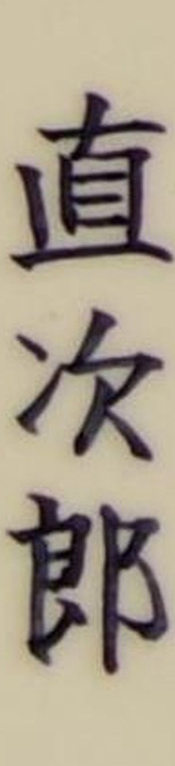直次郎
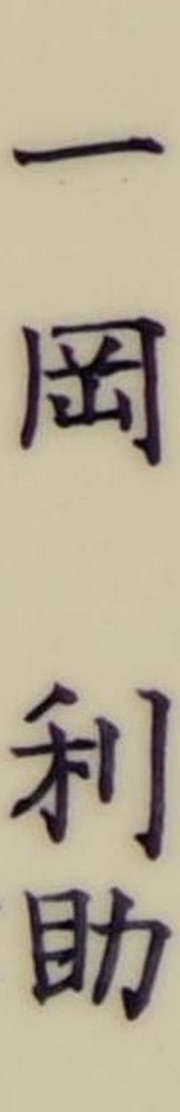一岡利助
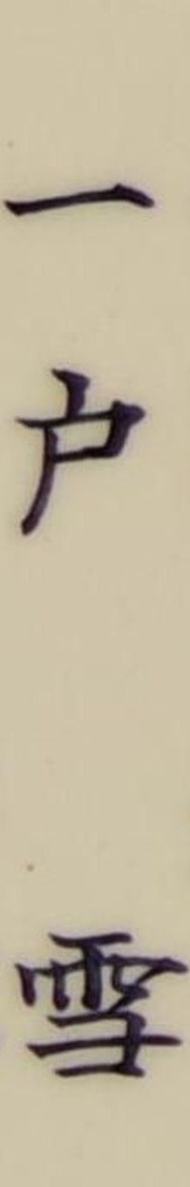一戸雪

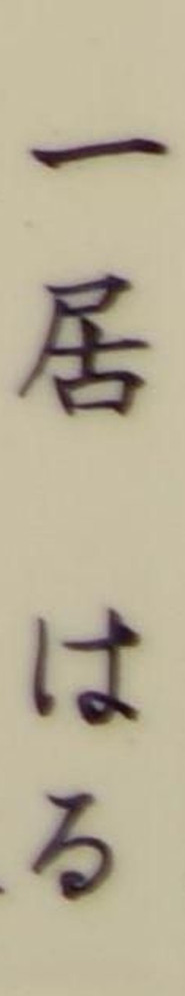一居はる
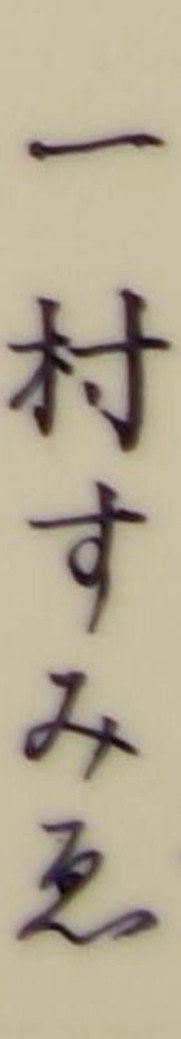一村すみえ
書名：E~L
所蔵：高野山金剛峯寺
